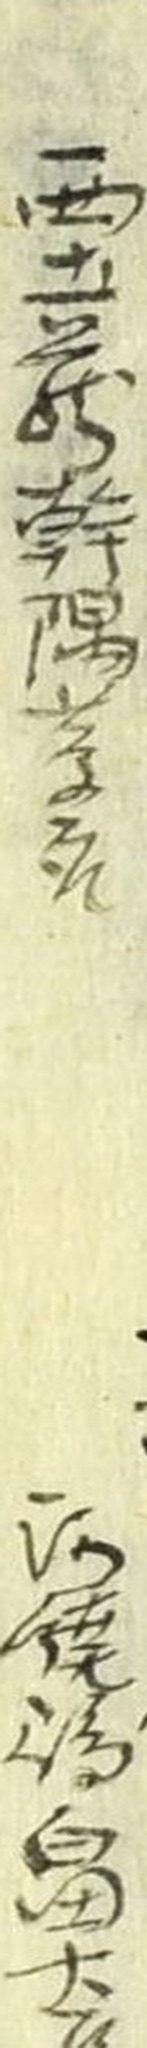西土蔵幹隅草取河饒島畠大豆植
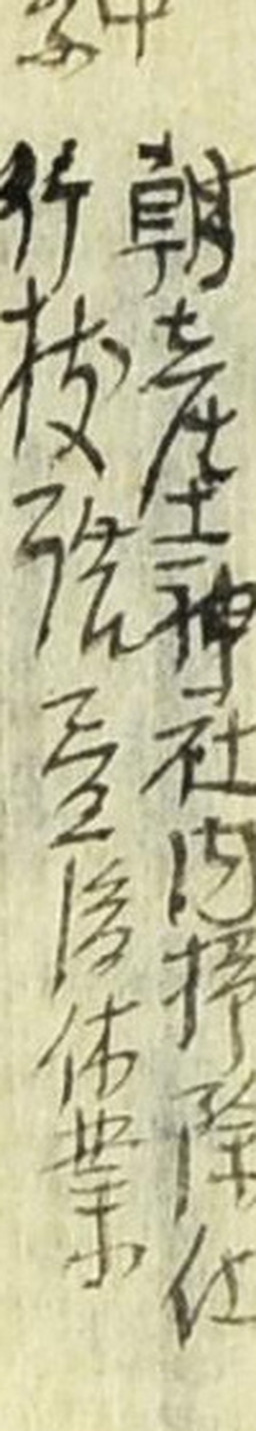祭竹枝詰昼後休業
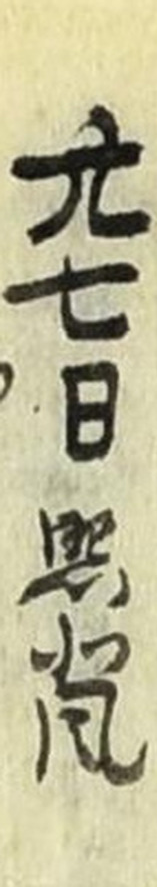廿七日照北風
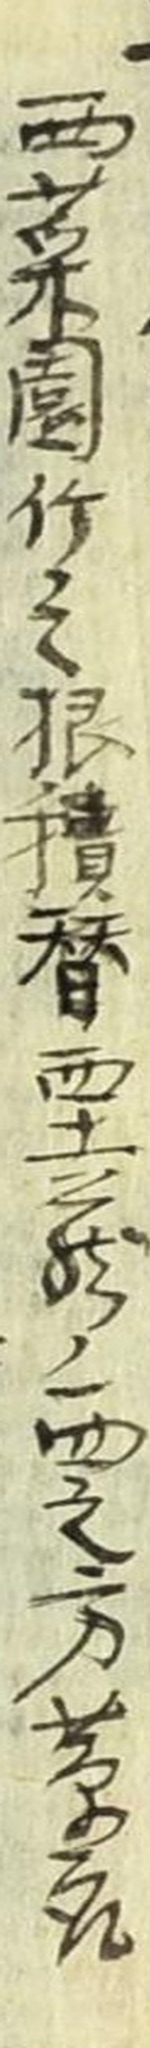西菜園竹之根積替西土蔵ノ西之方草取
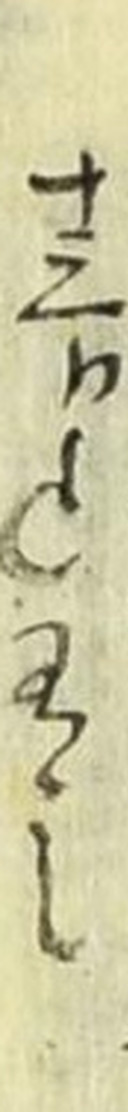十三日迄有之
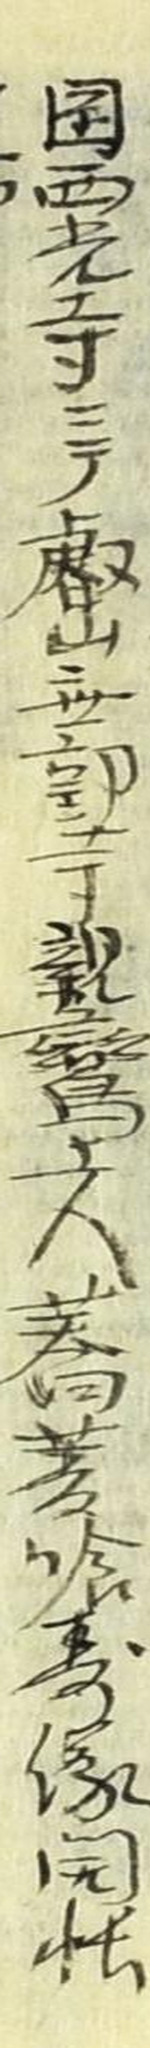岡西光寺ニテ叡山無動寺親鸞上人蕎菱喰寿像開帳
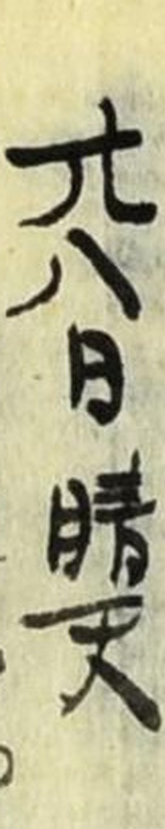廿八日晴天
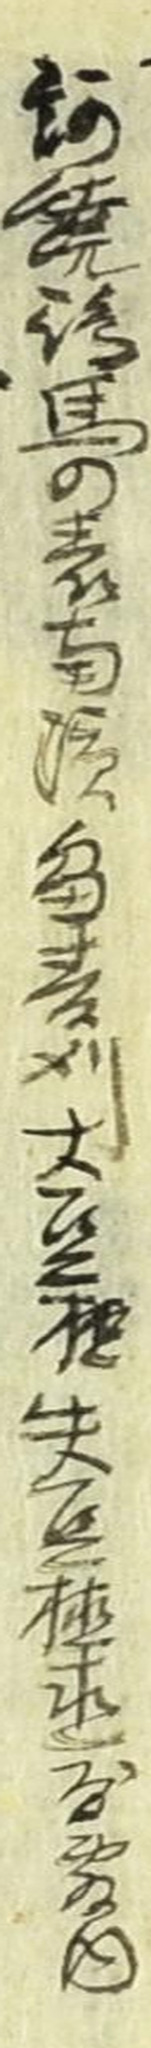河饒島馬の表南浜畠麦刈大豆植失豆植直屋敷内
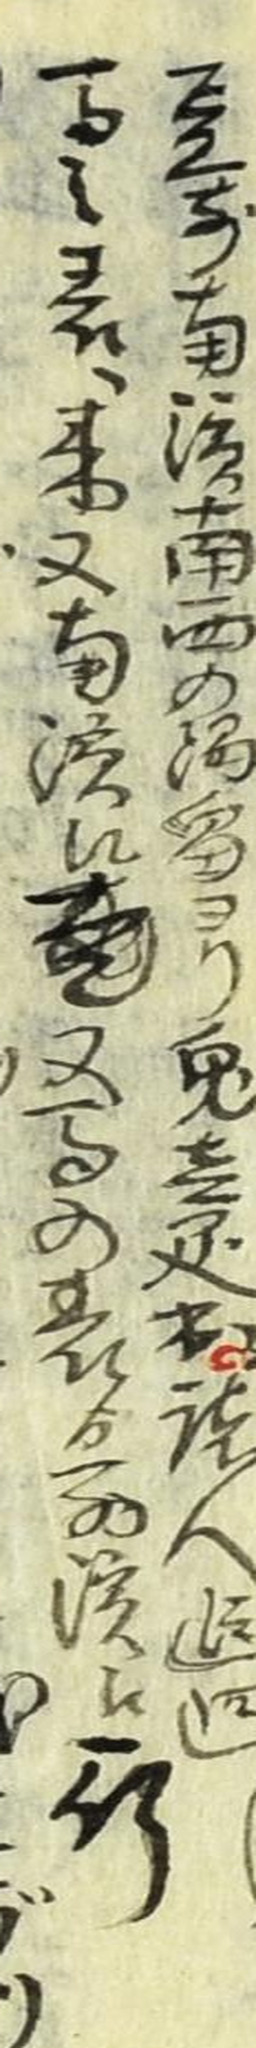馬の表へ来又南浜江去又馬の表ゟ西浜江一行
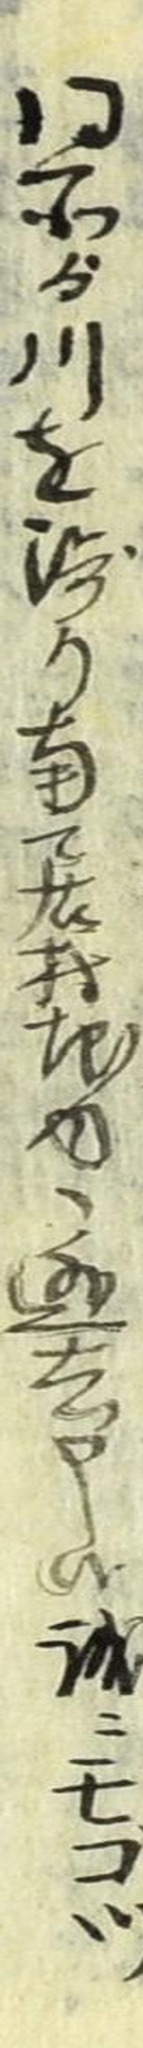同所ゟ川を渉り南居村地内へ逃去申候誠ニモゴツ
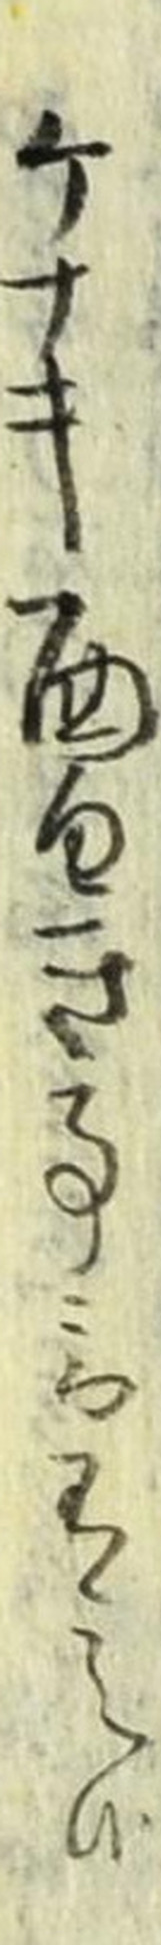ケナキ面白き事ニ而有之候
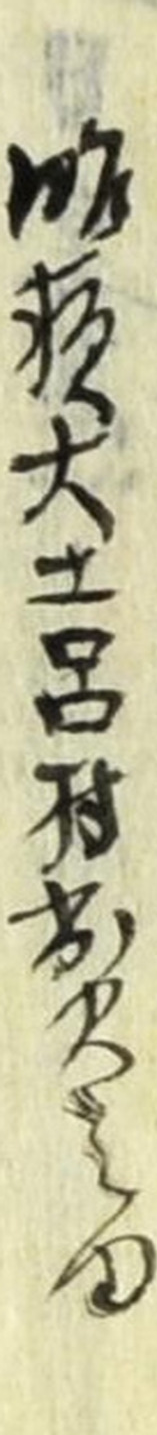昨夜大土呂村出火之由
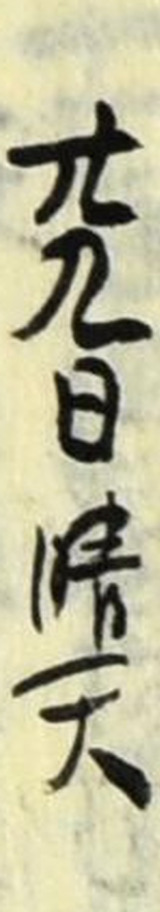廿八日晴天

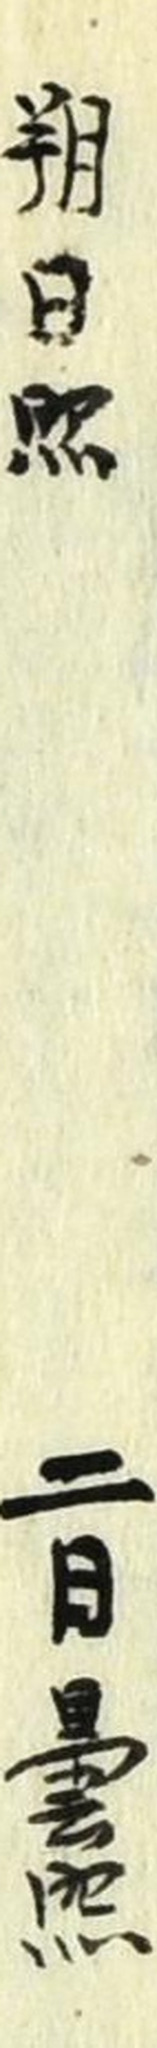朔日照二日曇照
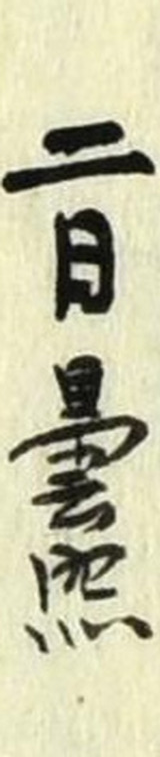三日曇照
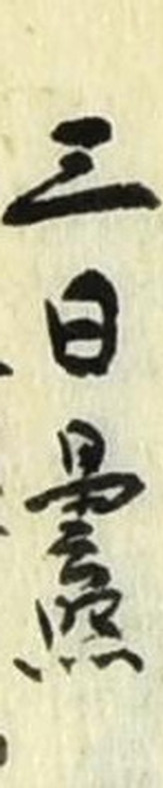三日曇照
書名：（日記）
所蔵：福井県文書館 Fukui Prefectural Archives
